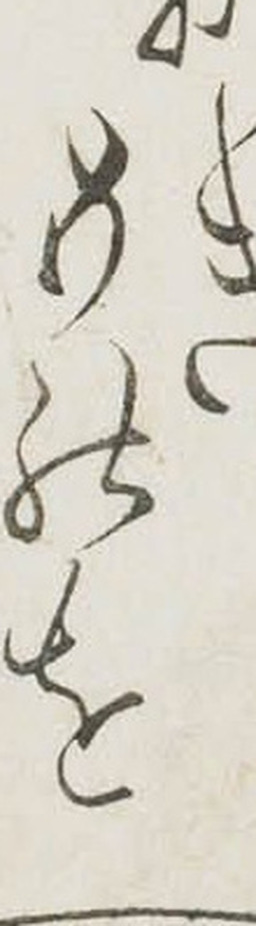ものを
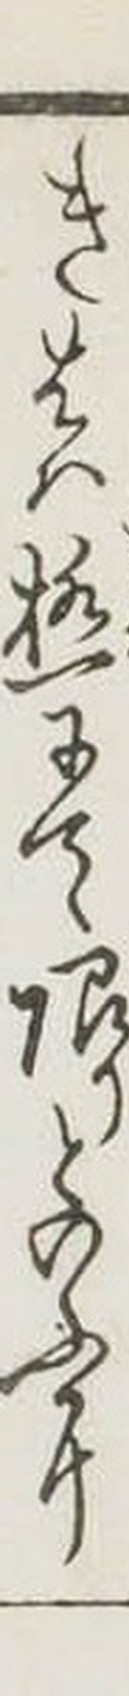きはは極にて限りとのふに
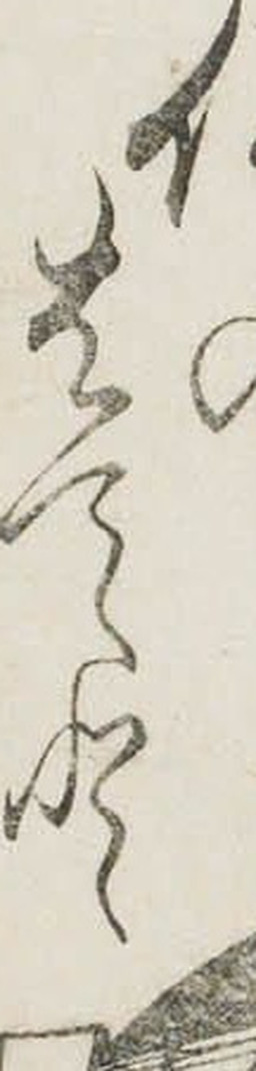はてと
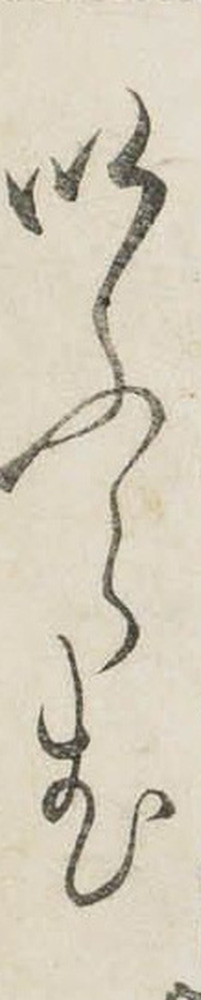いふらむ

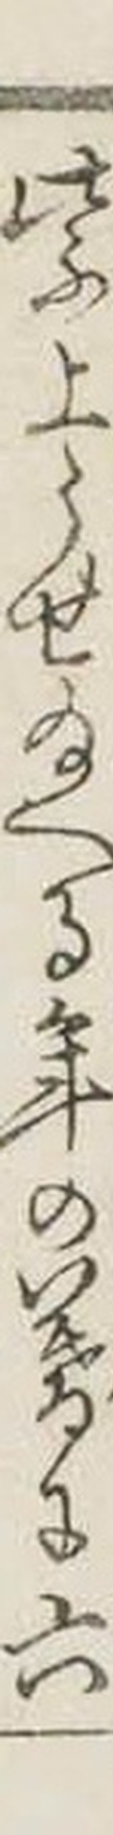紫上うせ給へる年の暮に六
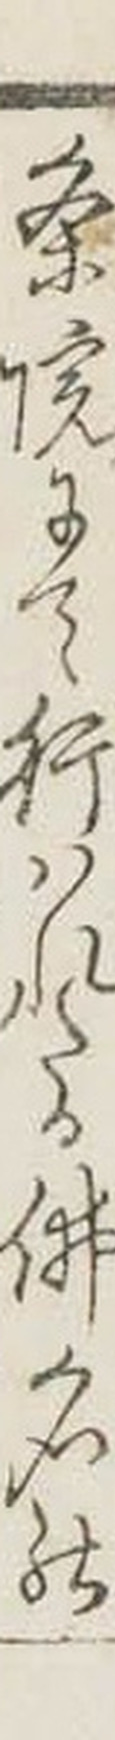条院にて行はれたる仏名の
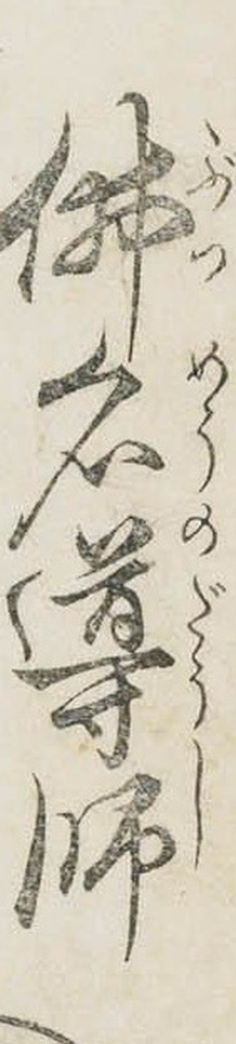仏名導師
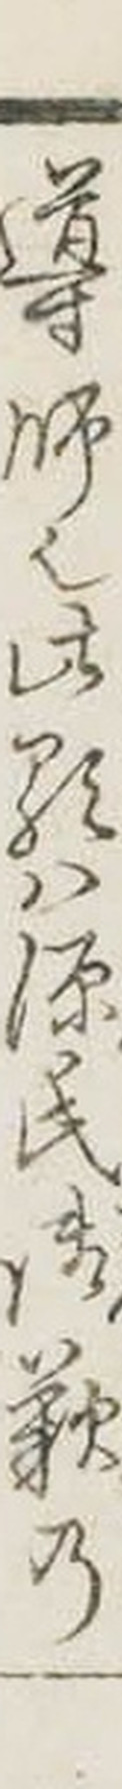導師也此歌は源氏御歎の
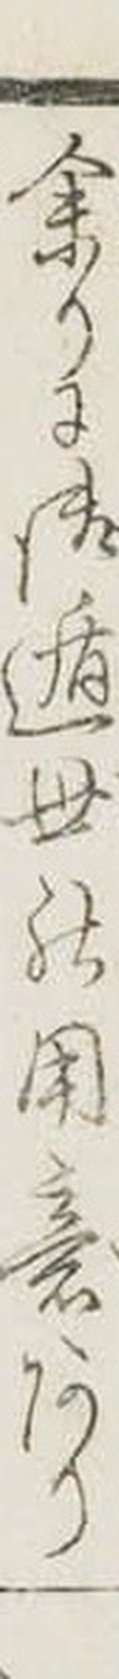余りに御遁世の用意あり
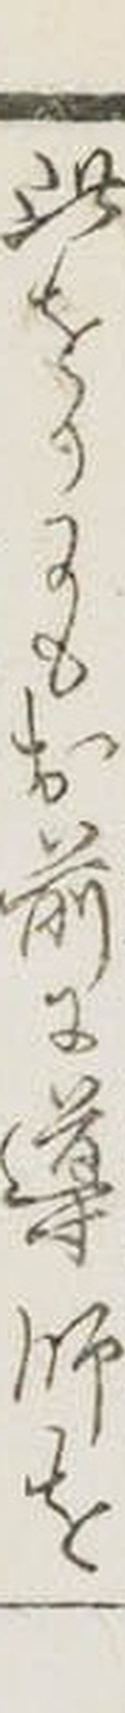此をりにもお前に導師を
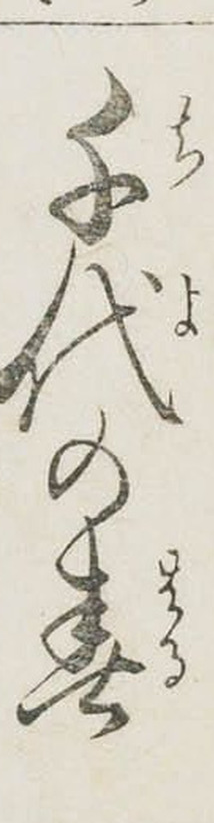千代の春
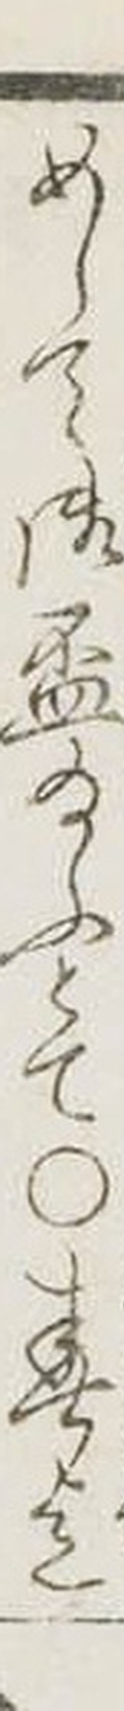めして御盃給ふとて○春迄
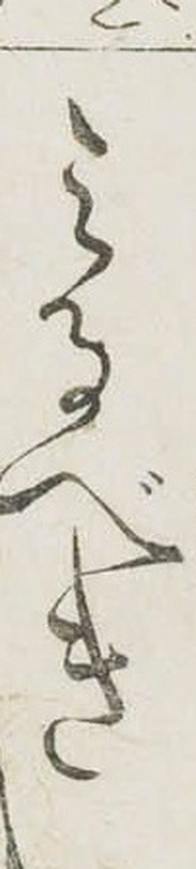みるべき
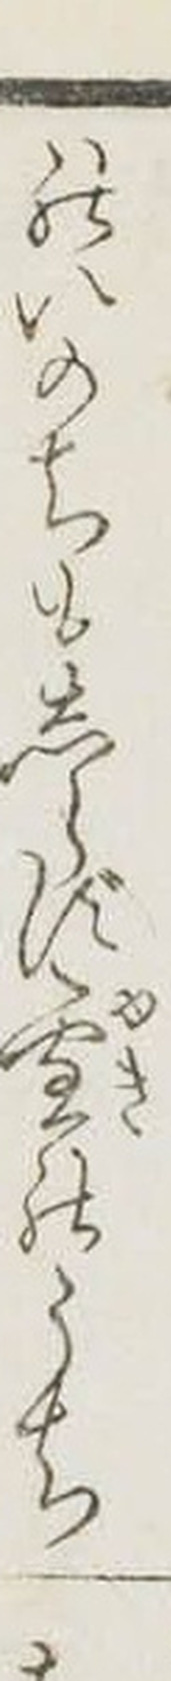のいのちもしらず雪のうち
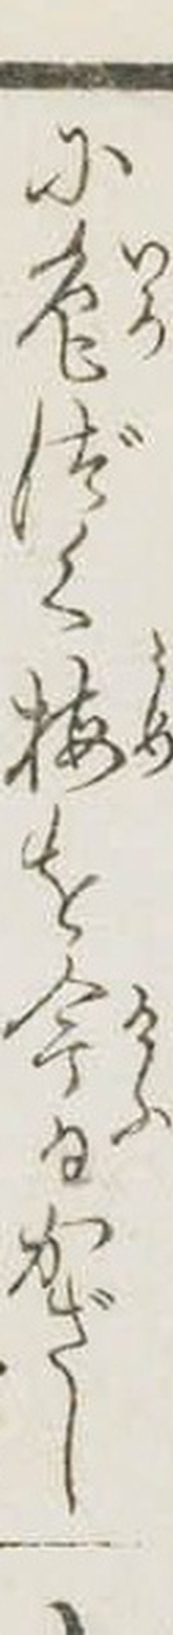に色づく梅を今日かざし
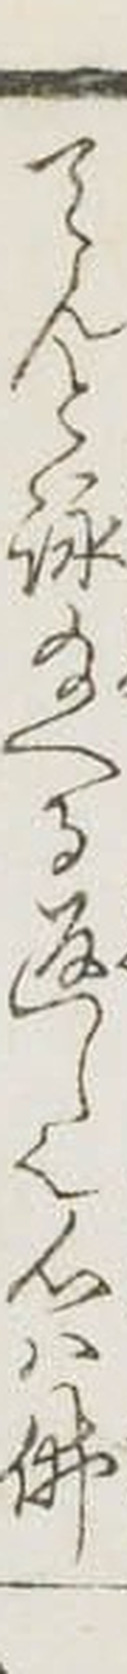てんと詠給へる返し也心は仏
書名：源氏百人一首
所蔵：東京学芸大学教育コンテンツアーカイブ
